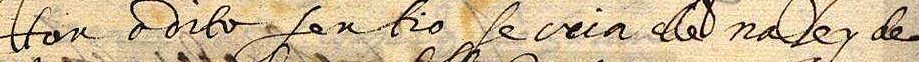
tou o dito seu tio se cria elle na ley de
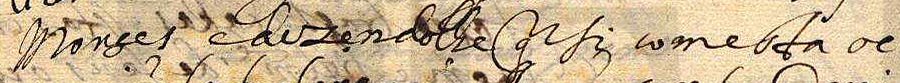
Mouses e dizendolhe q̄ si com esta oc
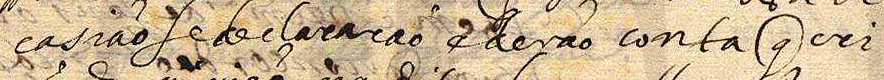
casiaõ se declararaõ e derão conta q̄ cri
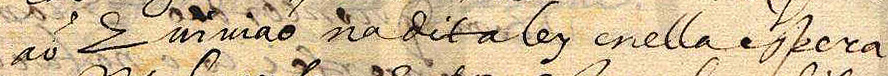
aõ E uiuiaõ na dita ley e nella espera
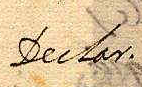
Declar.
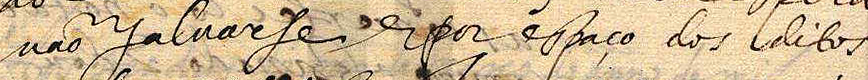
uaõ saluarse E por espaço dos ditos
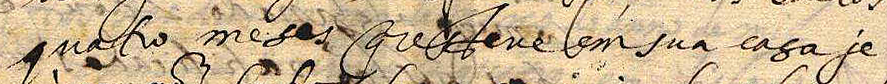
quatro meses q̄ esteue em sua casa je
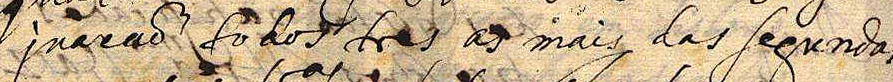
juaraõ todos tres as mais das segundas
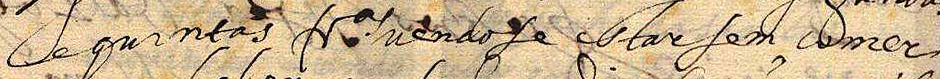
e quintas fr.as uendose estar sem comer
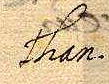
Than.
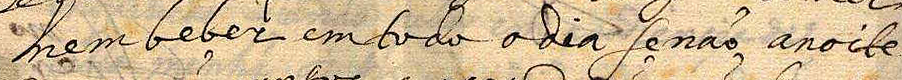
nem beber em todo o dia senaõ a noite
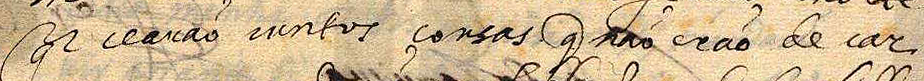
q̄ cearaõ iuntos cousas q̄ naõ eraõ de car
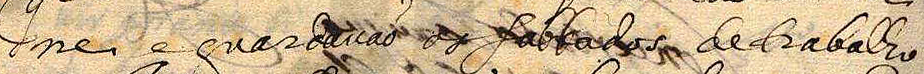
ne e guardauaõ os sabbados de trabalho
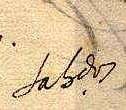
sab.dos
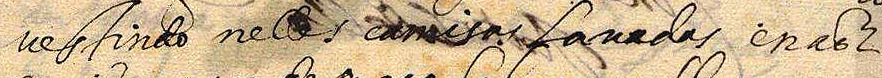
uestindo nelles camisas Lauadas e naõ
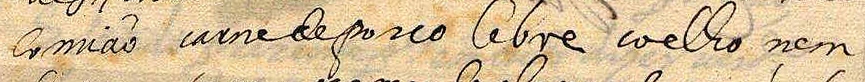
comiaõ carne de porco lebre coelho nem
